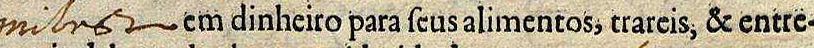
mil rs̄ em dinheiro para seus alimentos, trareis, & entre
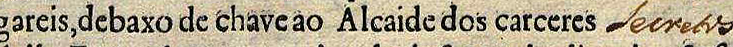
gareis, debaxo de chave ao Alcaide dos carceres secretos
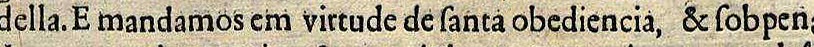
della. E mandamos em virtude de santa obediencia, & sob pena
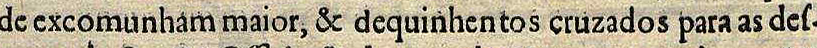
de excomunham maior, & de quinhentos cruzados para as des
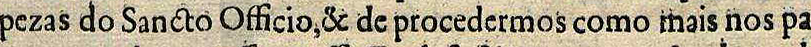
pezas do Sancto Officio, & de procedermos como mais nos pa
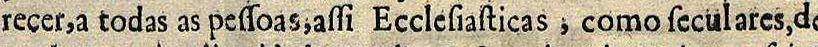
recer, a todas as pessoas, assi Ecclesiasticas; como seculares, de
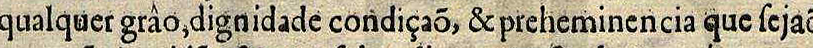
qualquer grâo, dignidade condiçaõ, & preheminencia que sejaõ
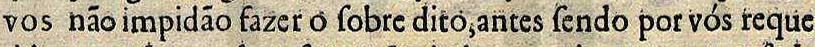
vos não impidão fazer o sobredito, antes sendo por vós reque
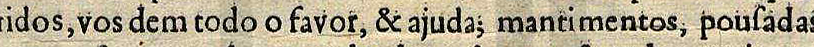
ridos, vos dem todo o favor, & ajuda; mantimentos, pousadas
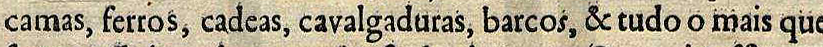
camas, ferros, cadeas, cavalgaduras, barcos, & tudo o mais que
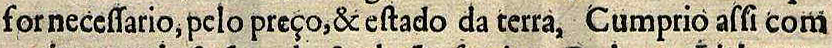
for necessario, pelo preço, & estado da terra, Cumprio assi com
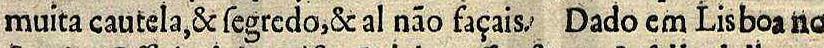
muita cautela, & segredo, & al não façais. Dado em Lisboa no
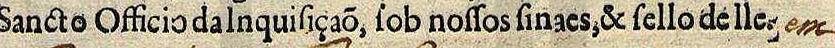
Sancto Officio da Inquisiçaõ, sob nossos sinaes, & sello delle. em
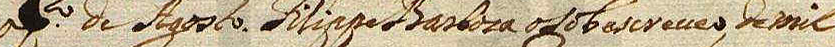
o p.ro de Agosto Filippe Barboza o sobescreueo, de mil
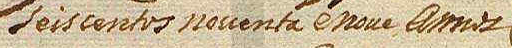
seiscentos nouenta e noue annos
